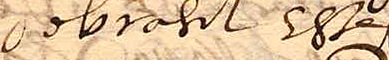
do brasil Este
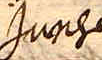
Junho
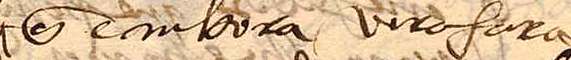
q̄ embora vira fara
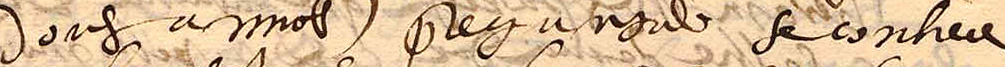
dous annos preguntado se conhece
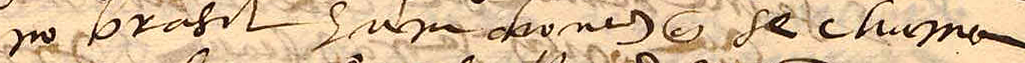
no brasiL hum homē q̄ se chama
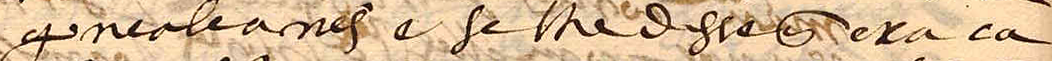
goncaleanes e se lhe disse q̄ era ca
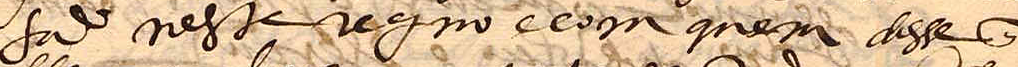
sado neste regno e com quem disse q̄
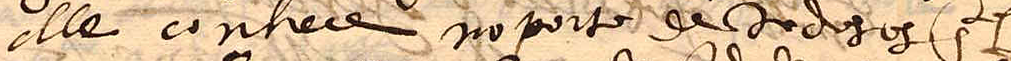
elle conhece no porto de todos os stos
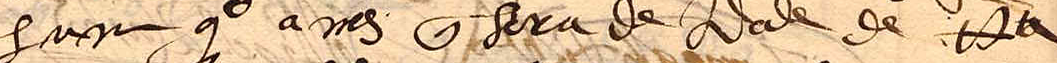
hum go anes q̄ sera de Idade de Rta
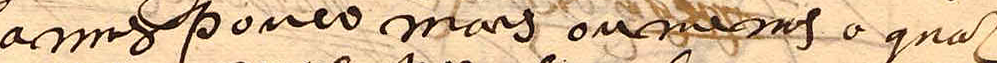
annos pouco mais ou menos o quaL
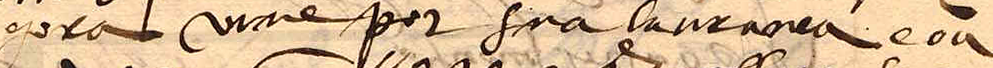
agora viue por sua lauranca e ou
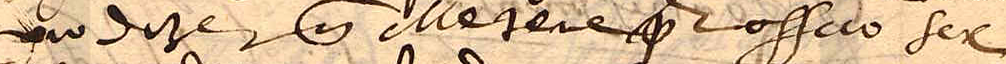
vio dizer q̄ elle teue p̄o offcio ser
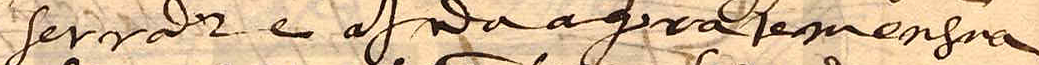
serrador e aJnda agora tem en sua
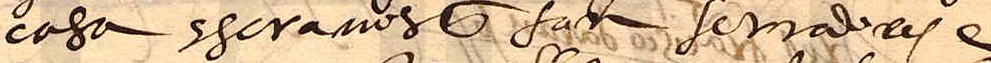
casa Escrauos q̄ san serradores e
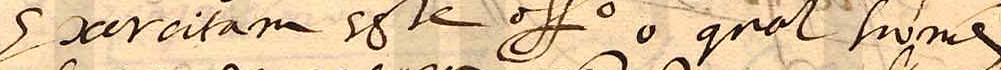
Exercitam Este offo o qual homē
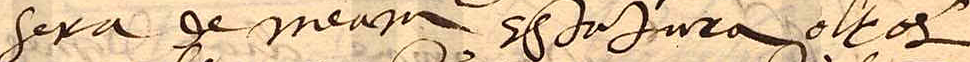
sera de meam Estatura olhos
